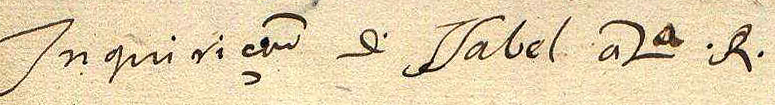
Jnquirição de Jsabel āta .R.
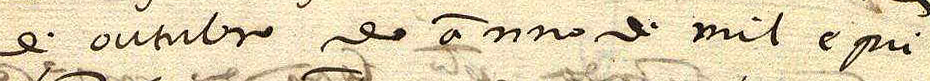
de outubro do anno de mil e qui
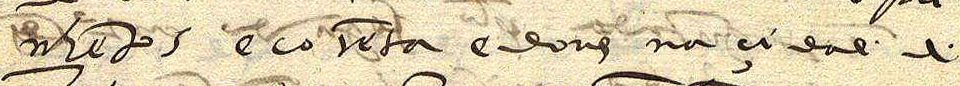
nhētos e cor̄eta e dous na cidade de
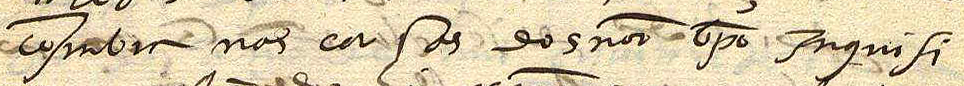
coJmbra nas casas do sn̄or b̄po Jnquisi
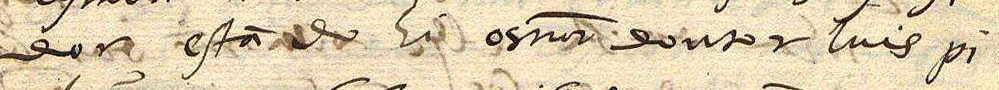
dos estādo hi o sn̄or doutor luis pi
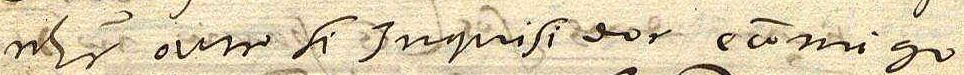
nhro outrosi Jnquisidor e c̄omigo
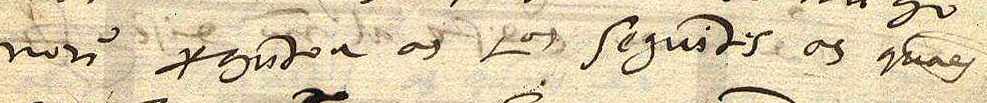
notro ꝑgūtou as tas seguītes as quaes
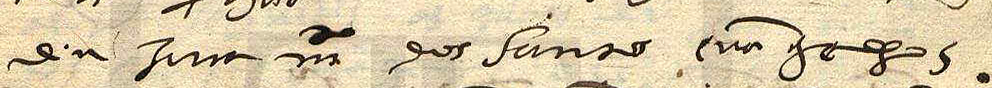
deu Juramto dos Santos euāgelhos
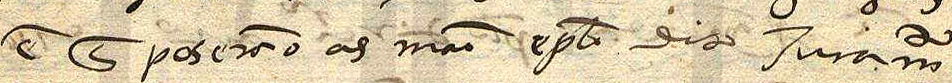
ē q̄ poserão as mão e p̄lo dito Juramto
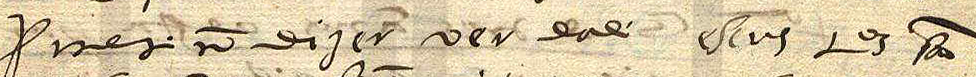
ꝓmeter̄o dizer verdade e seus tos são
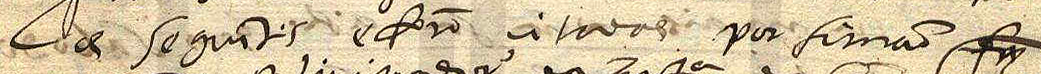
os seguītes e forō citadas por simão f̄rz
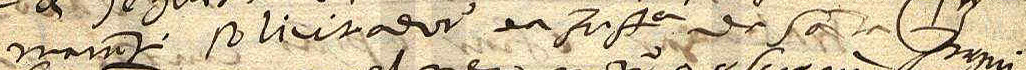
marāte solicitador da Justa da sāta Jnqui
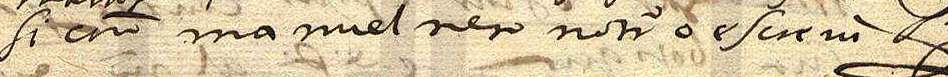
sição manuel neto notro o escreui
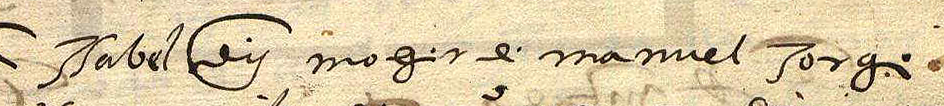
item Jsabel d̄iz molher de manuel Jorge
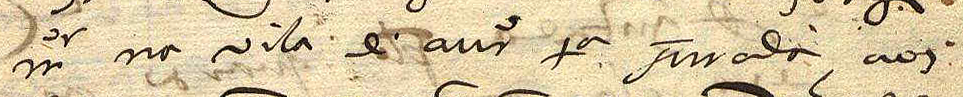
mor na vila de auro ta Jurada aos
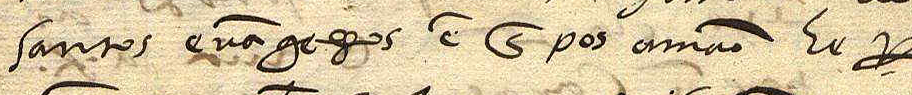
Santos euāgelhos ē q̄ pos a mão he ꝑ
